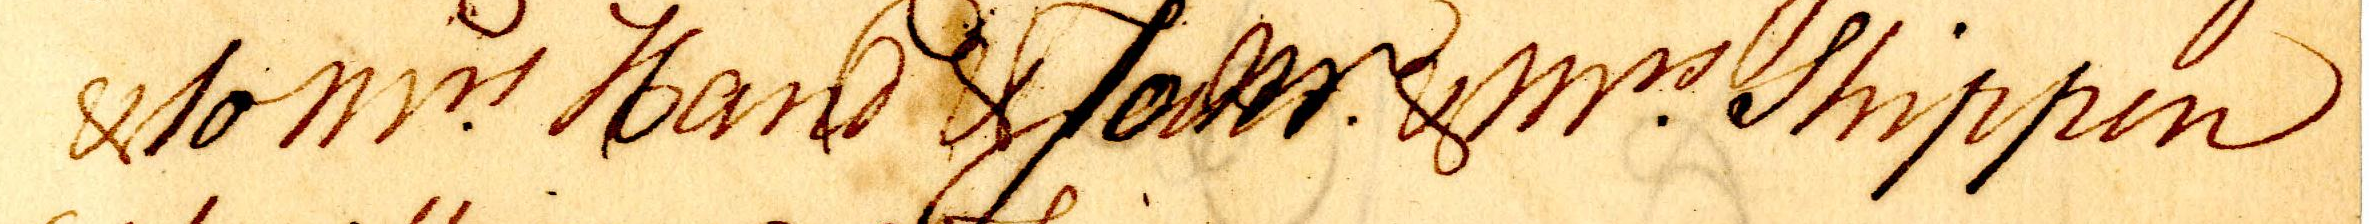& so M^rs. Hand & James & M^rs. Shippen
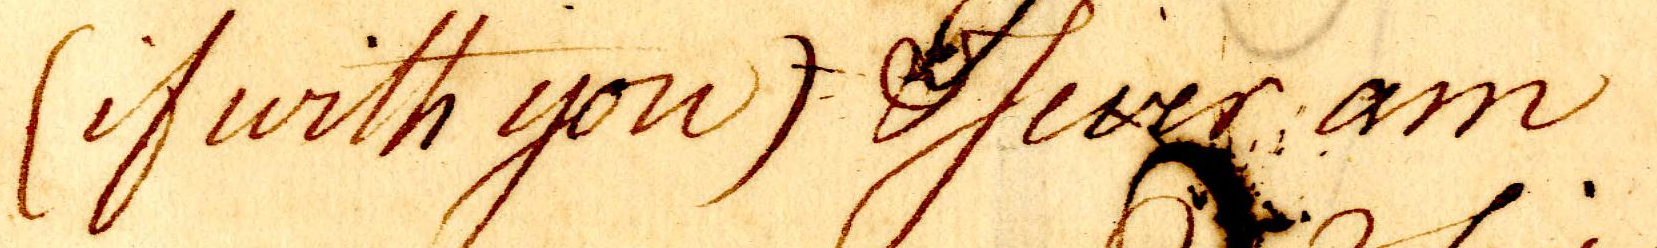(if with you) & I ever am
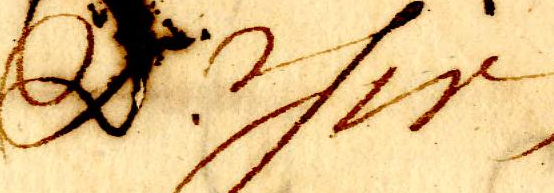D^r. Sir
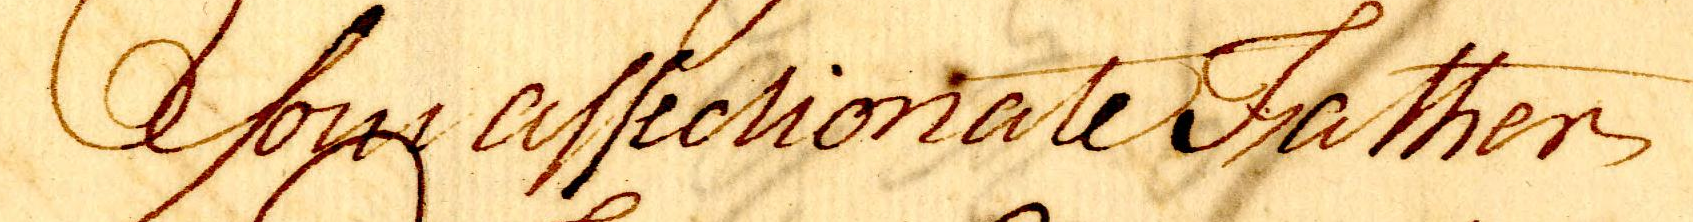Your affectionate Father
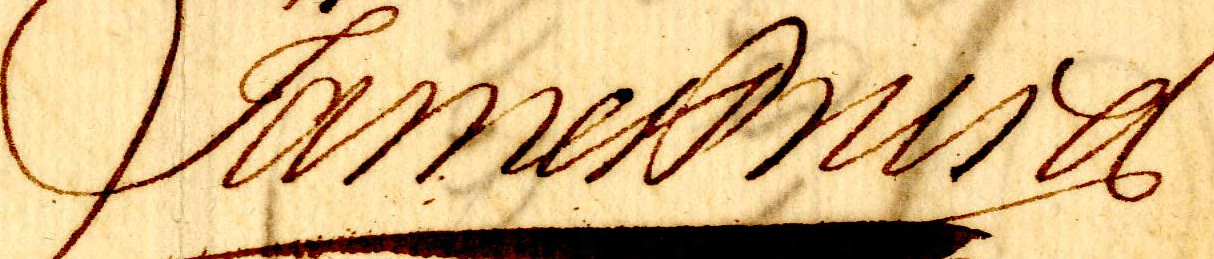James Burd
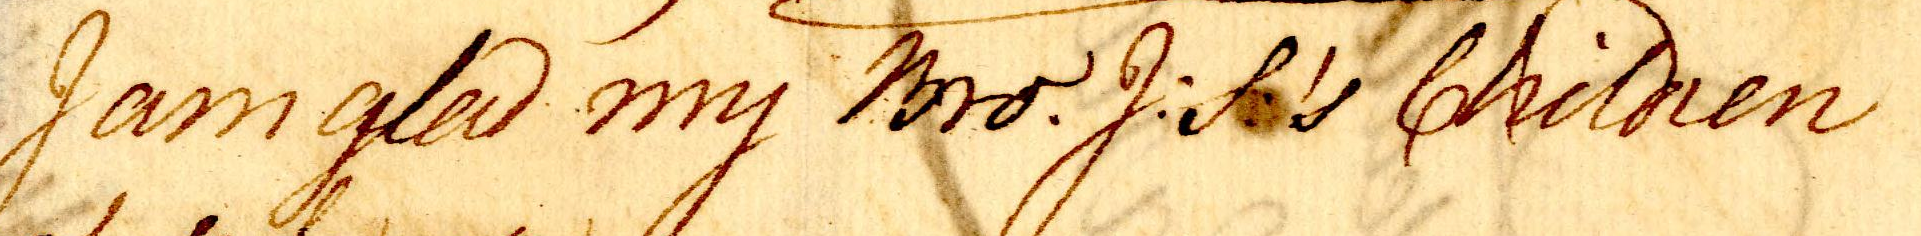I am glad my Bro. J:S.'s Children
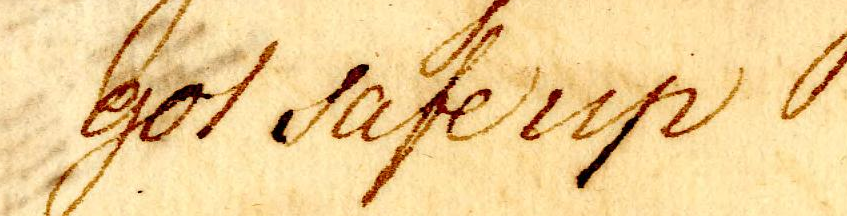got safe up
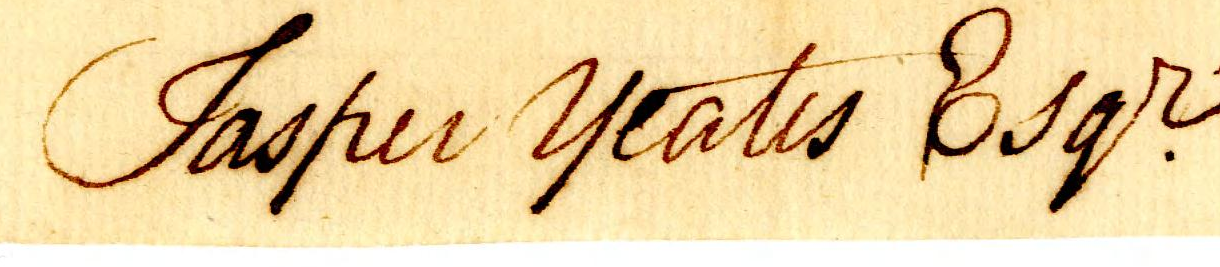Jasper Yeates Esq^r.
